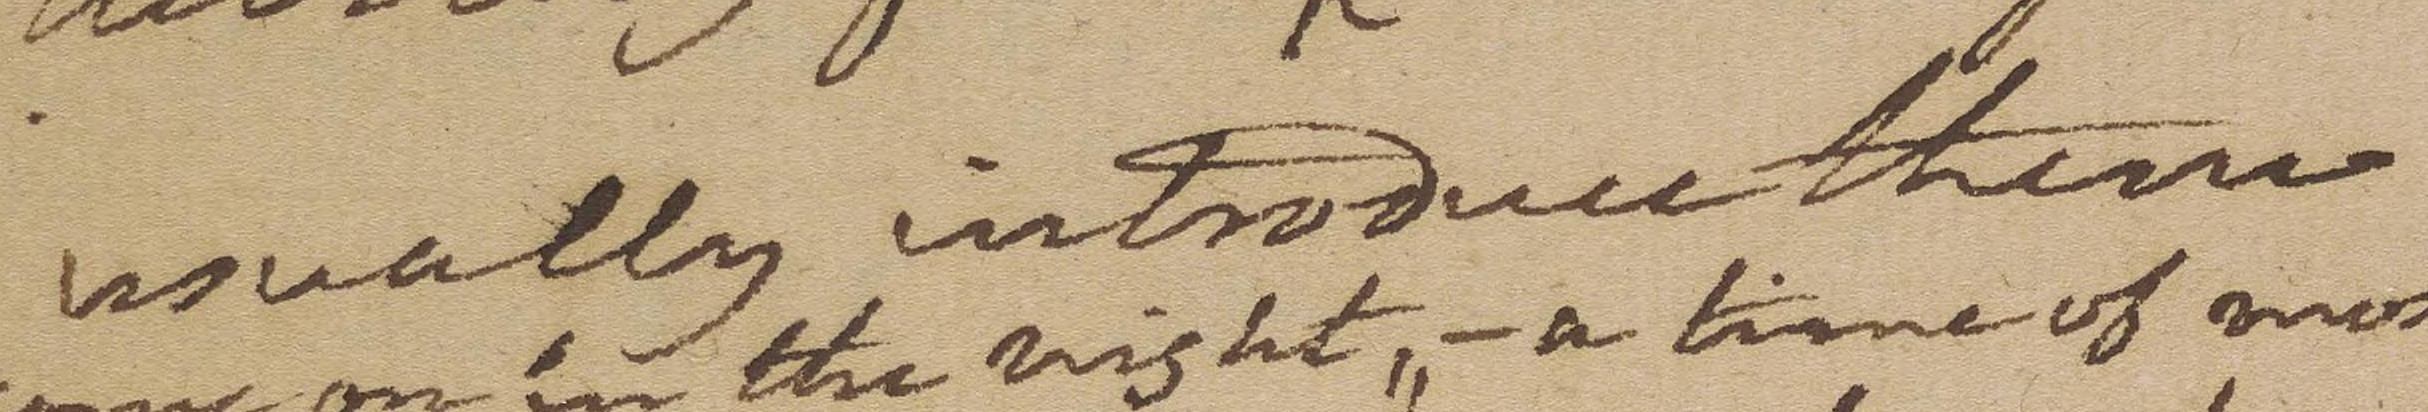usually introduce there
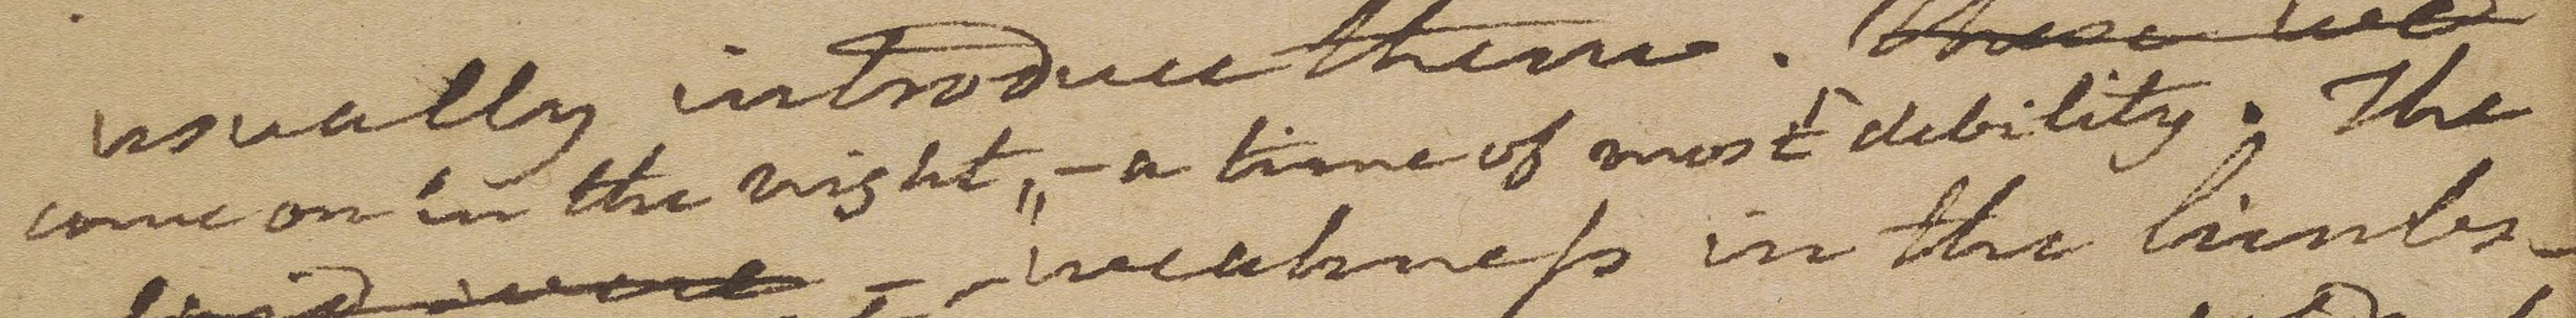come on in the night, a time of most debility. The
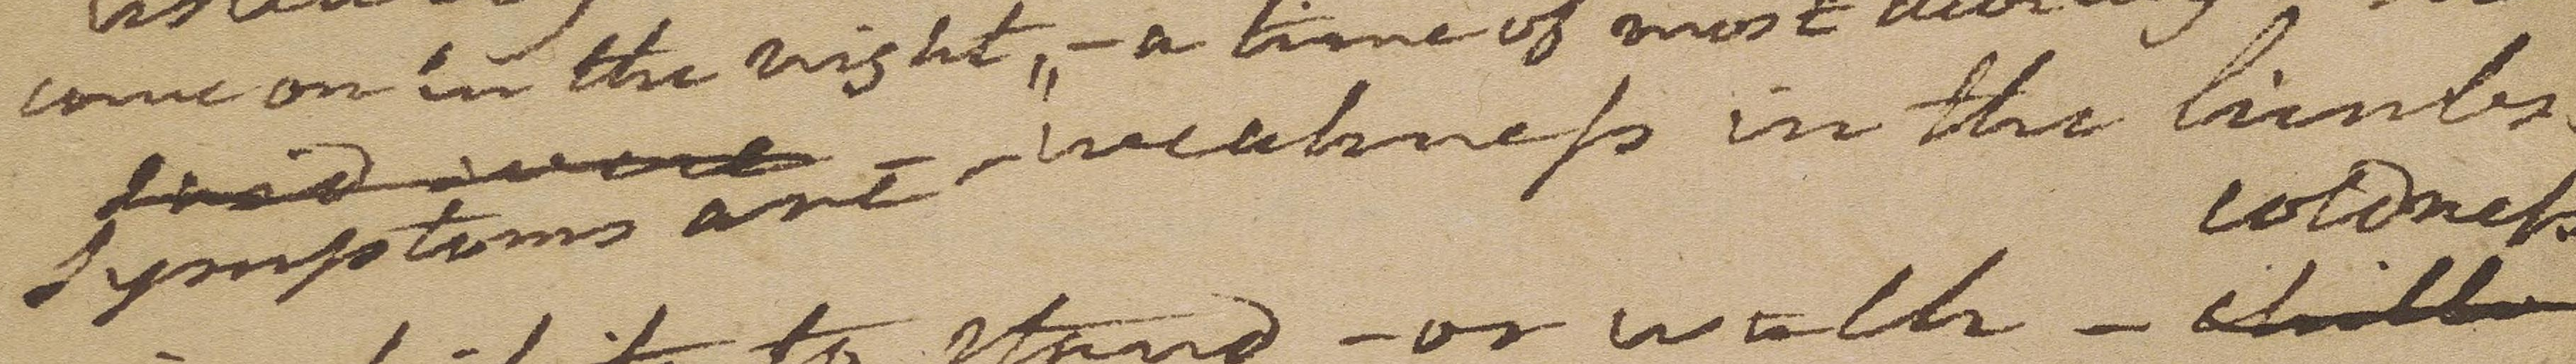symptoms are weakness in the limbs,
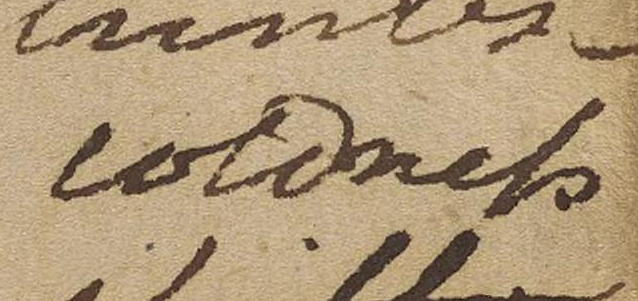coldness
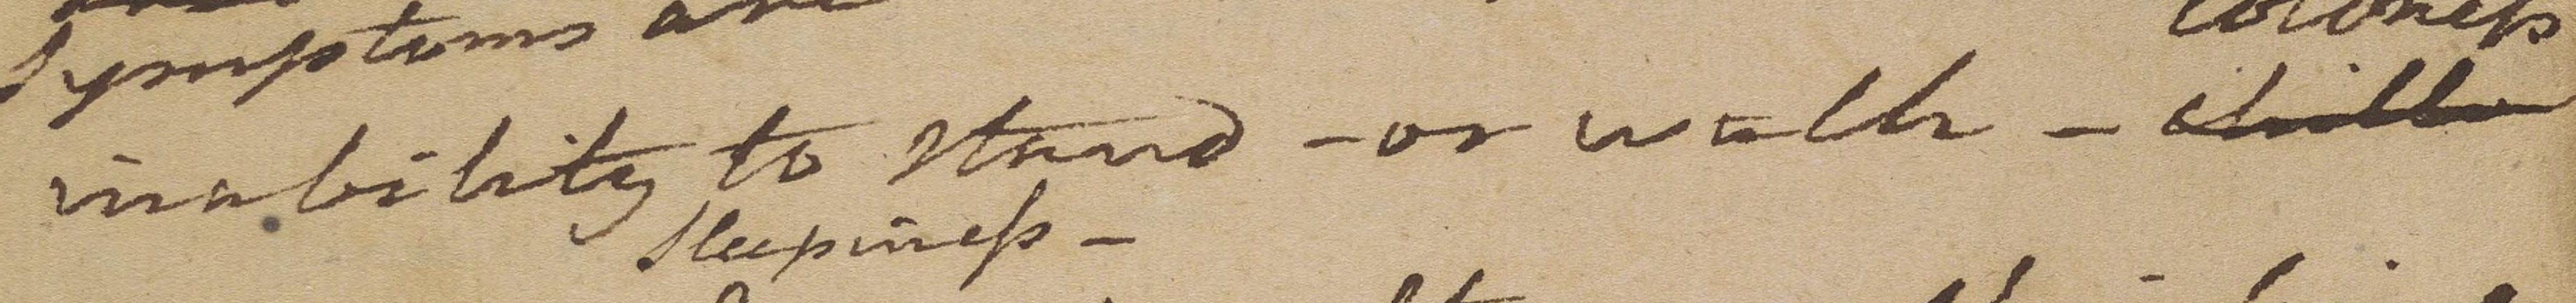inability to stand- or walk- [chills]
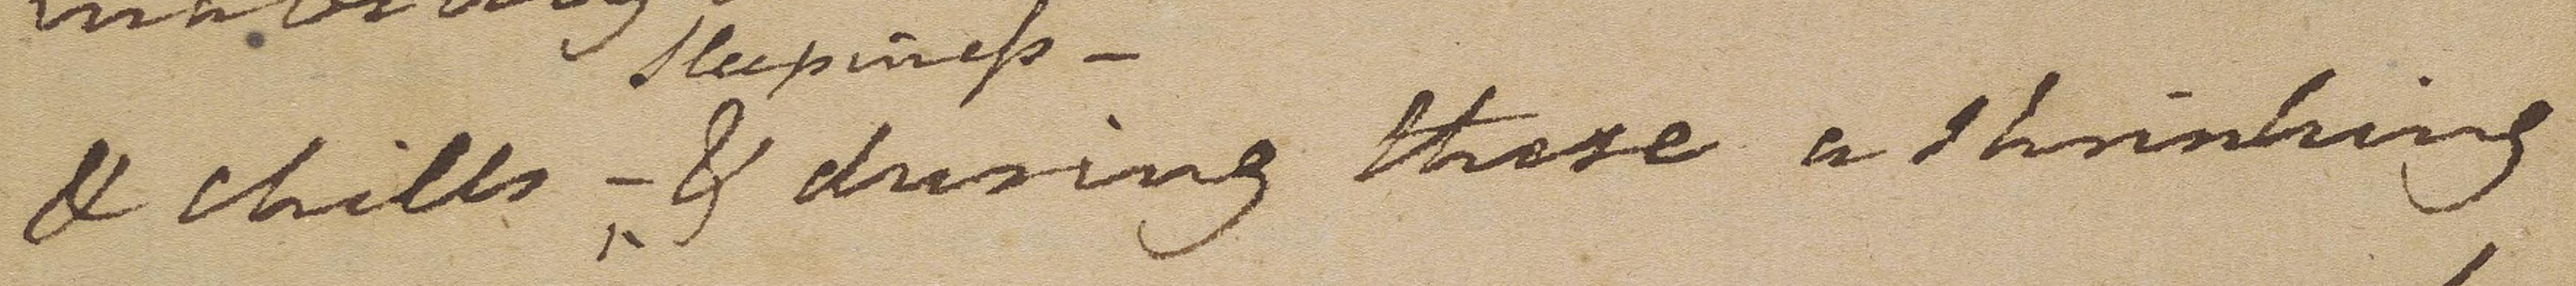& chills- ^ & during those a shrinking
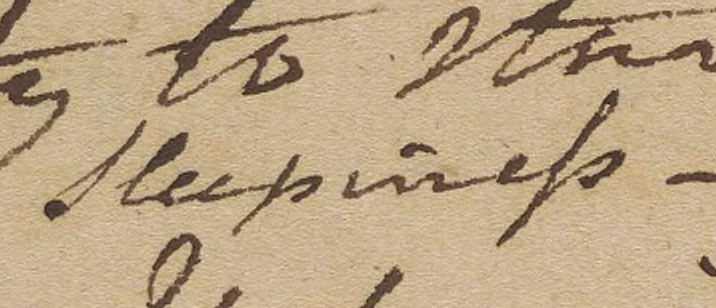sleepiness
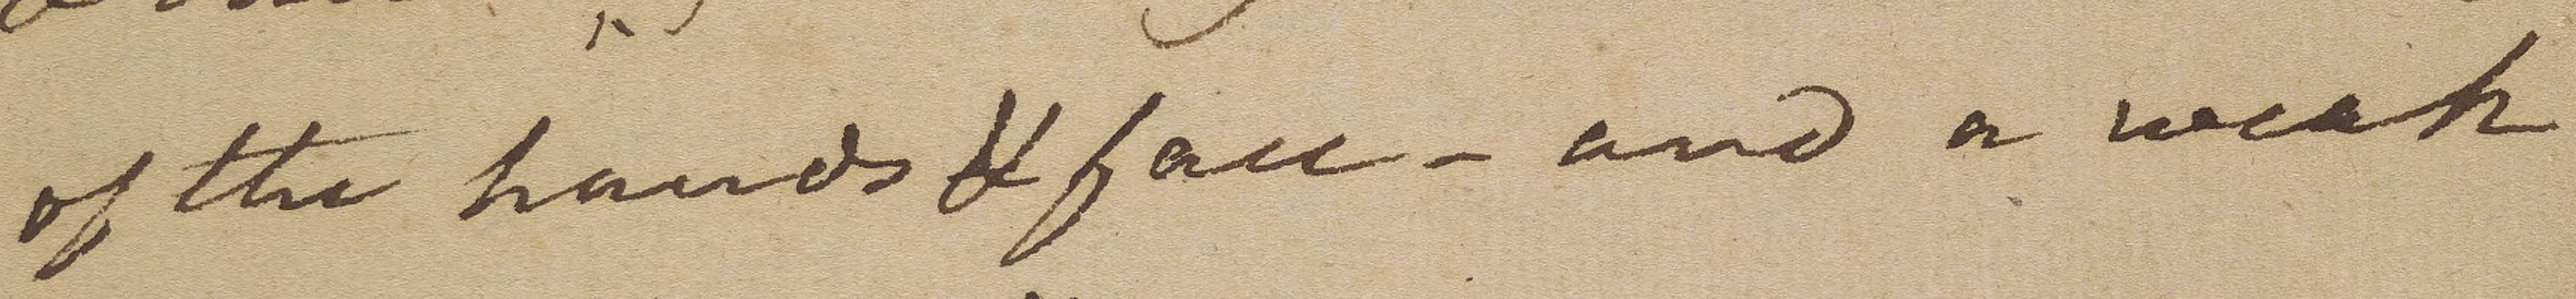of the hands & face, and a weak
